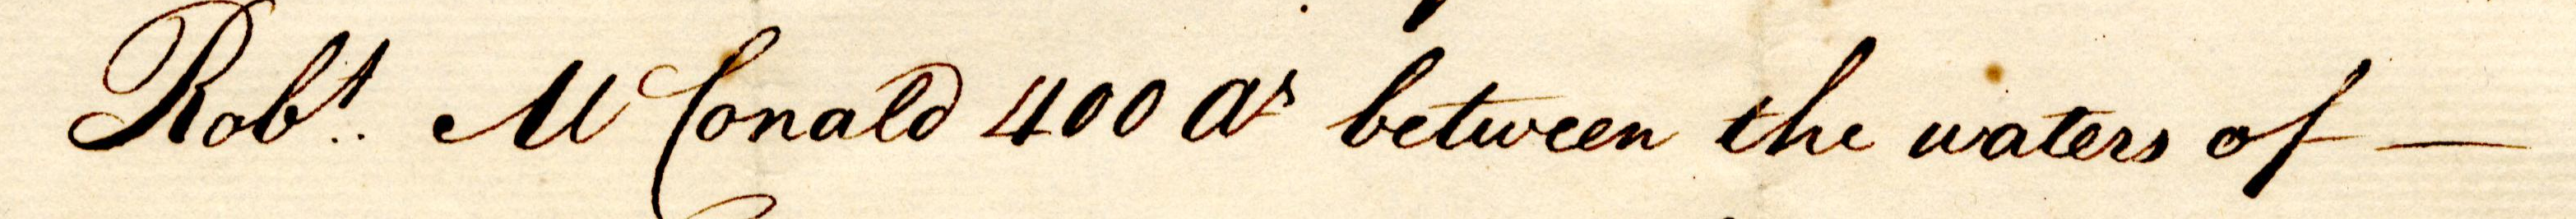Rob^t. M Conald 400 A^s between the waters of-
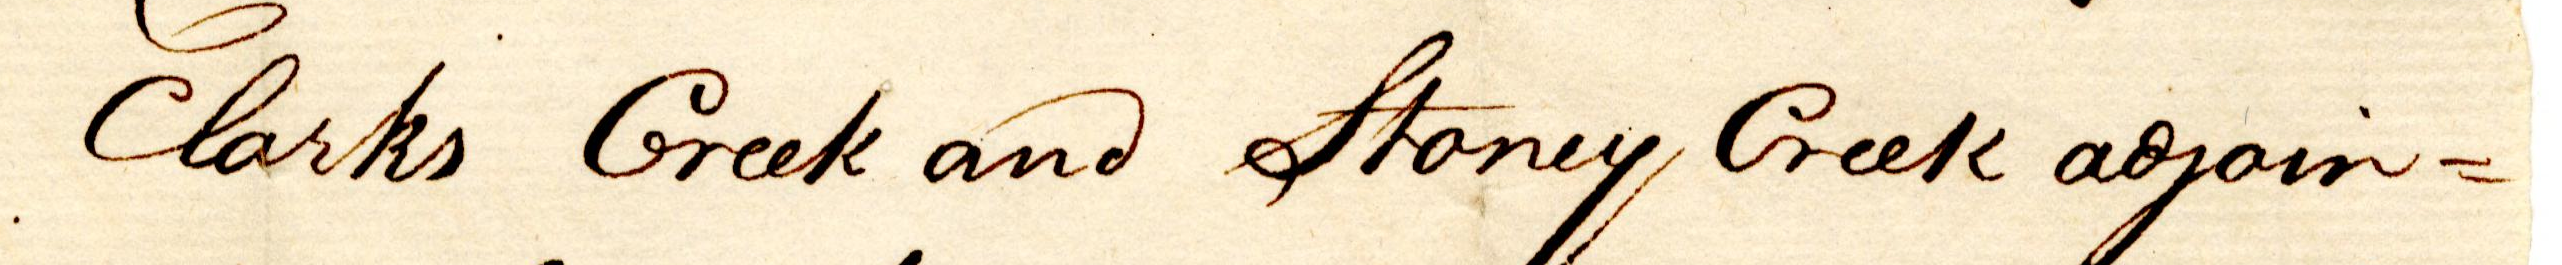Clarks Creek and Stoney Creek adjoin-
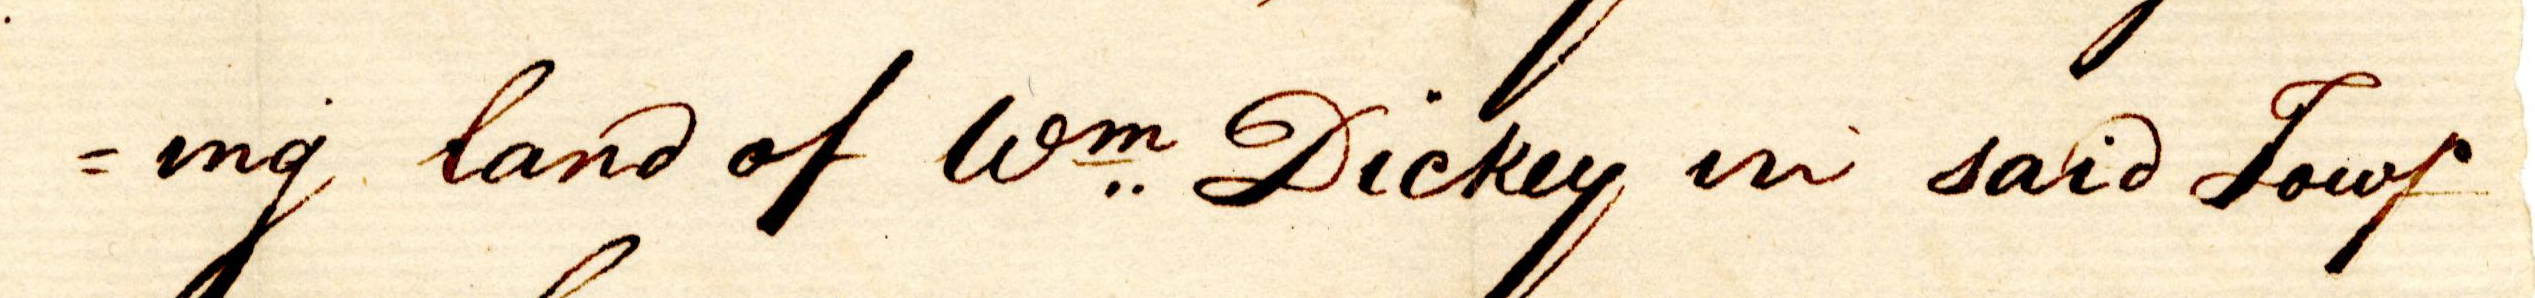-ing land of W^m. Dickey in said Tow^p
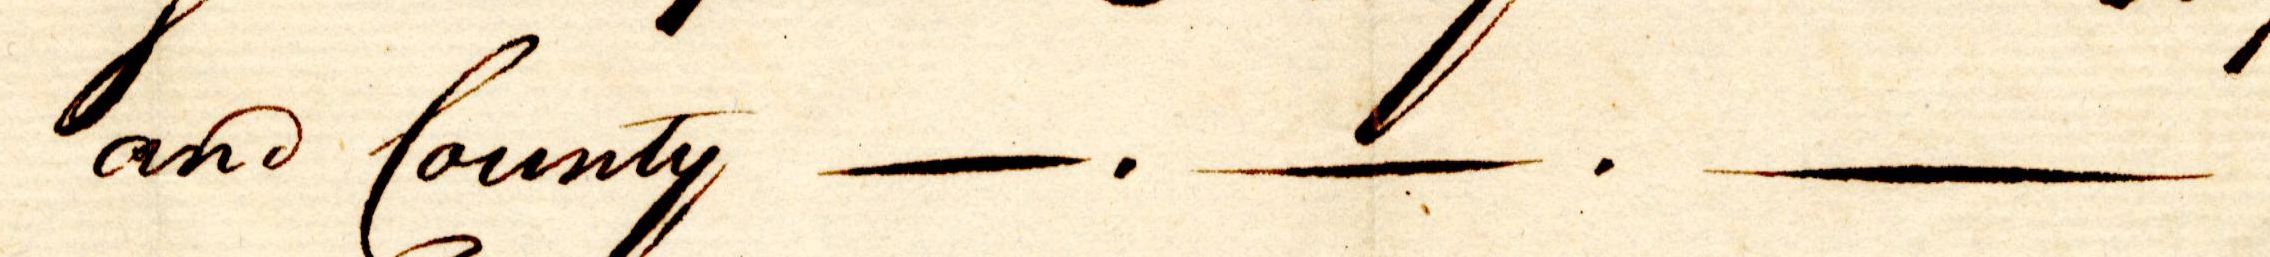and County-.-.-
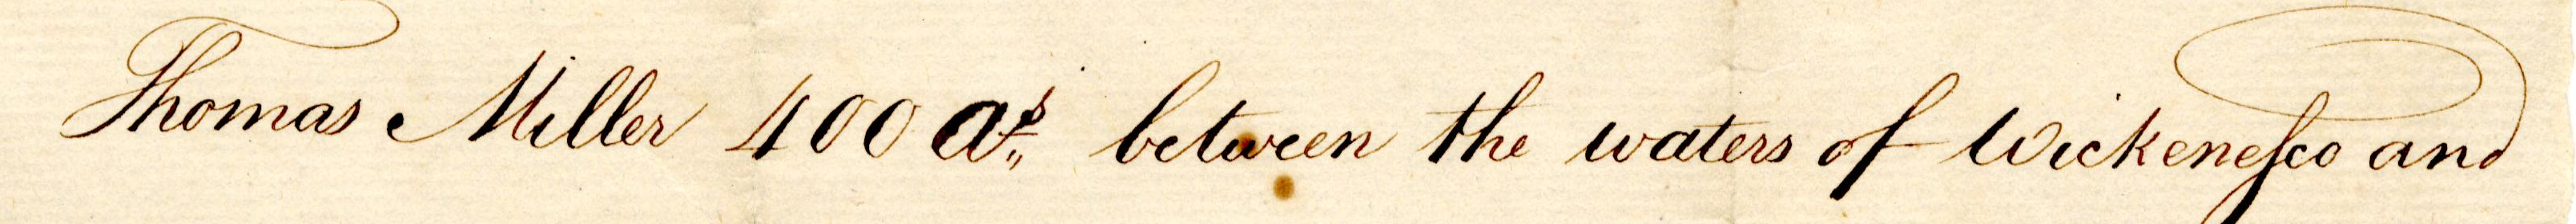Thomas Miller 400 A^s. between the waters of Wickenesco and
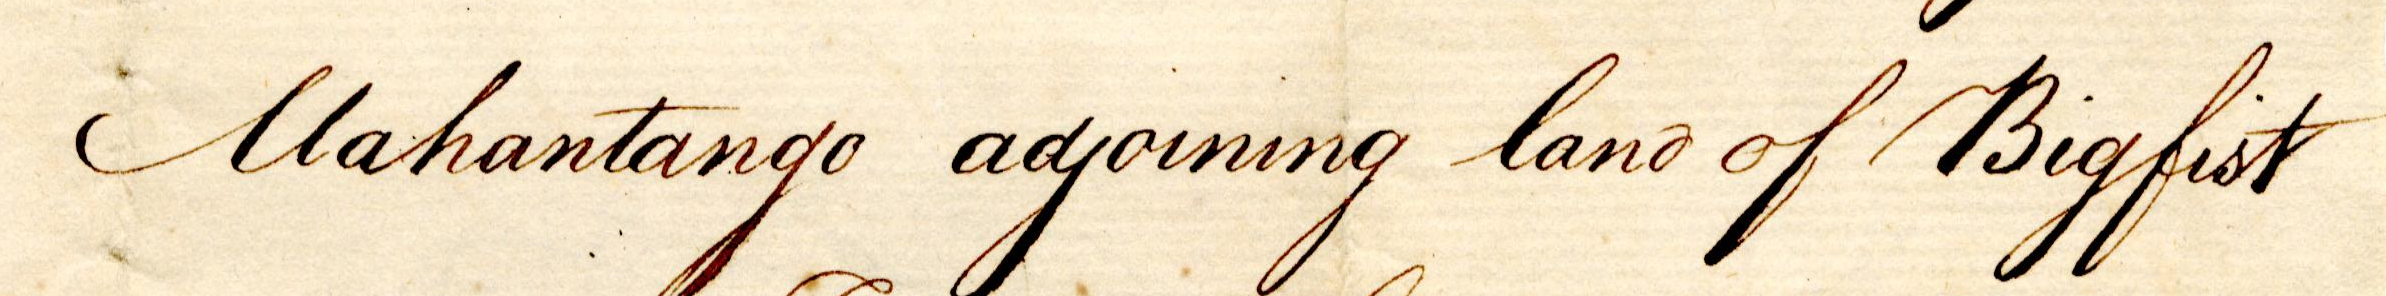Mahantango adjoining land of Bigfist
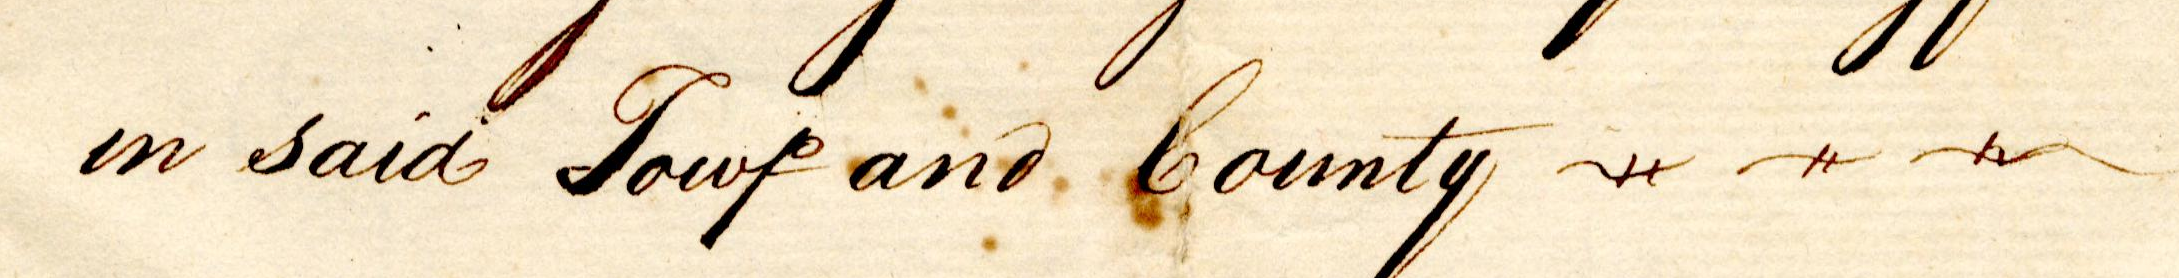in said Tow^p and County---
